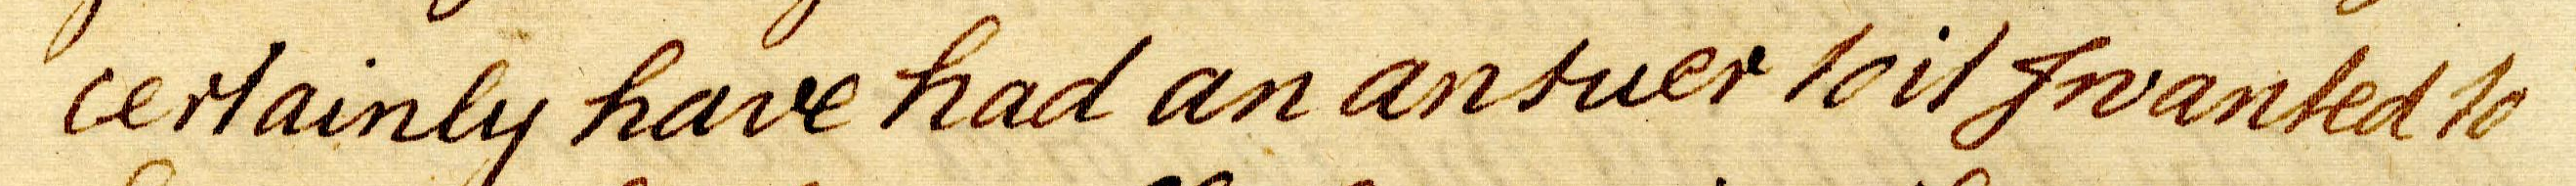certainly have had an answer to it I wanted to
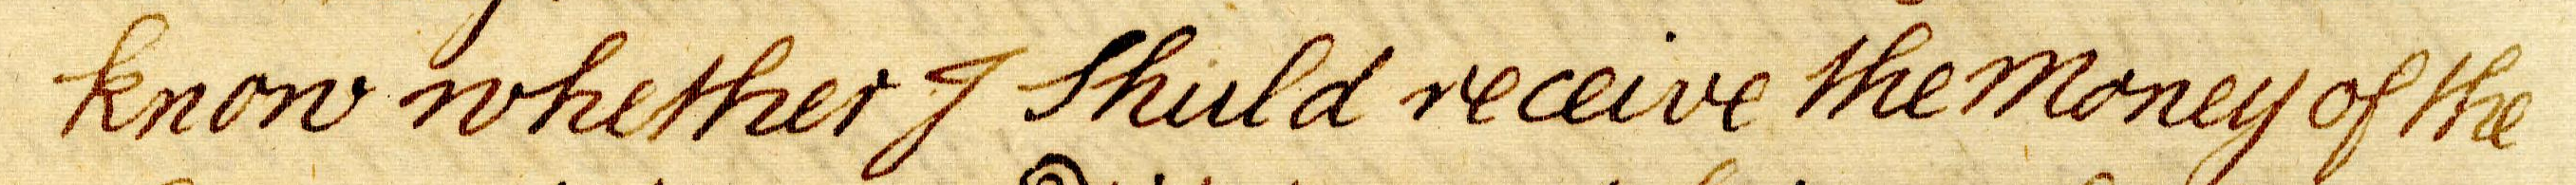know whether I Shuld receive the Money of the
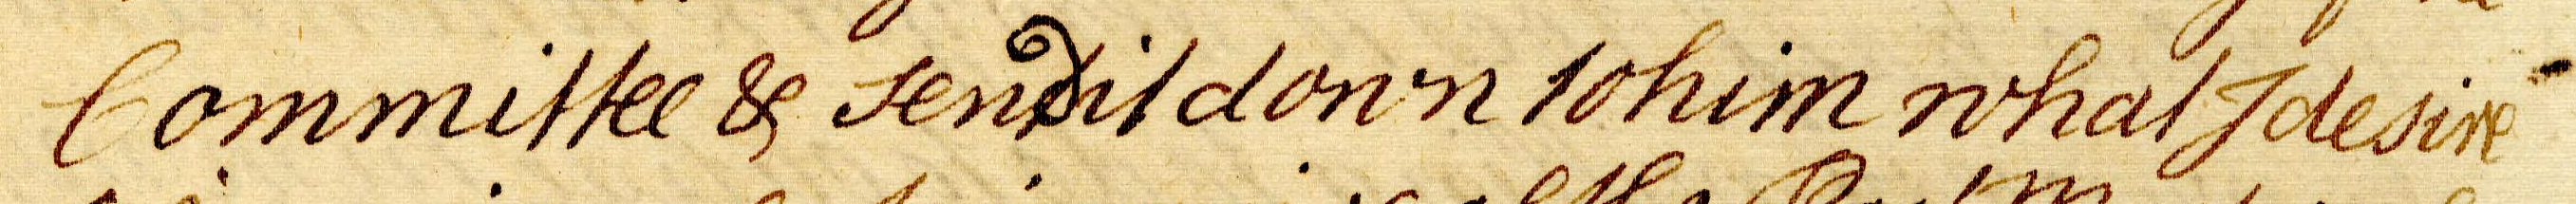Committee & send it down to him what I desire
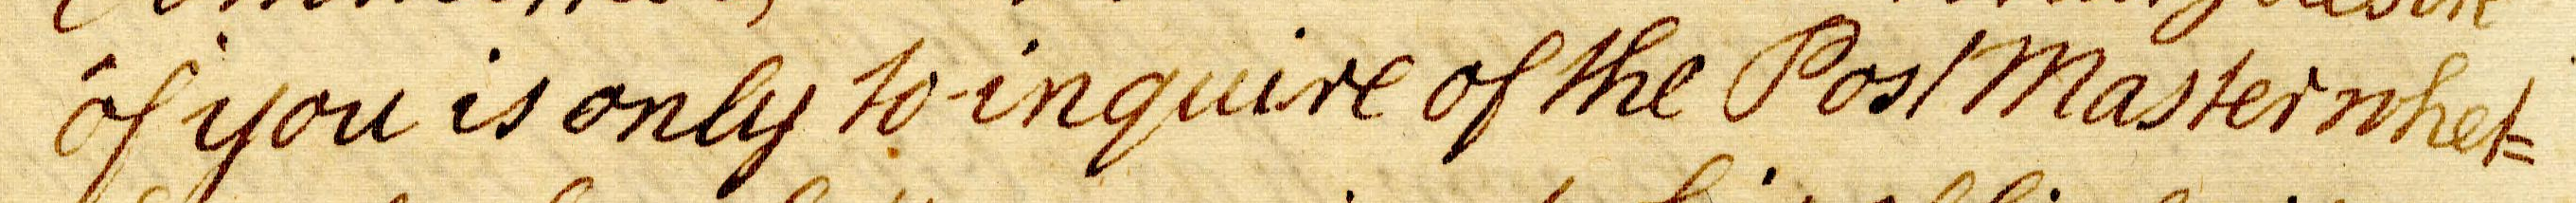of you is only to-inquire of the Post Master whet=
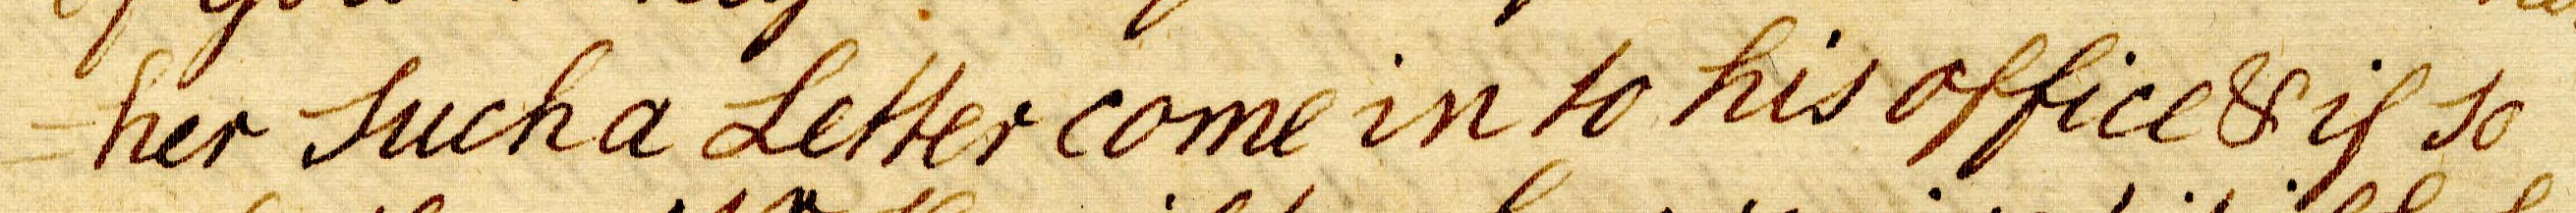=her such a Letter come in to his office & if so
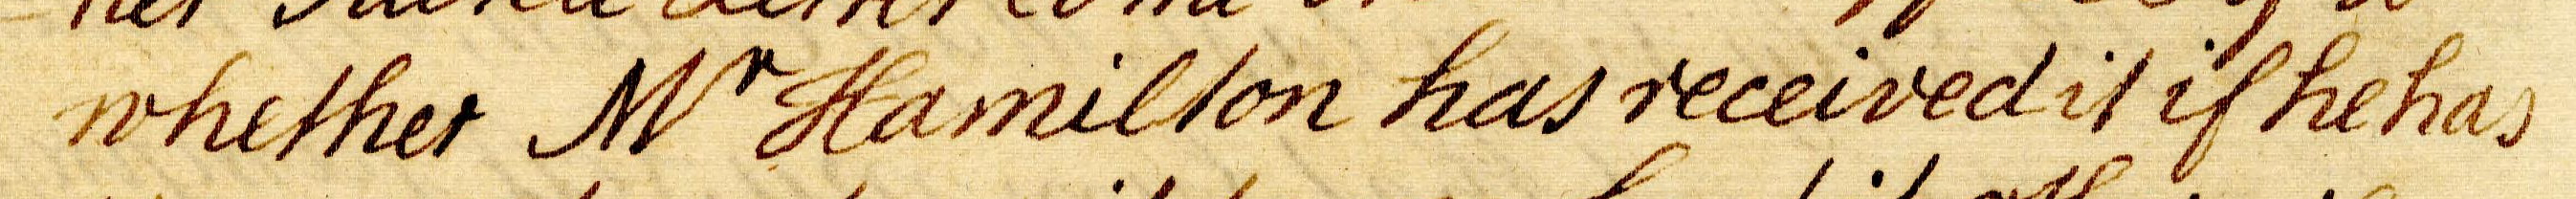whether M^r Hamilton has received it if he has
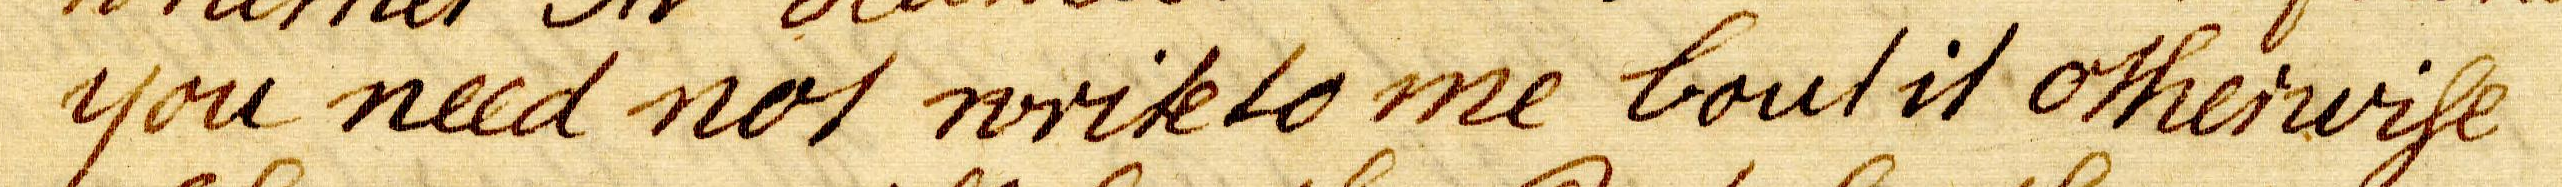you need not write to me bout it otherwise
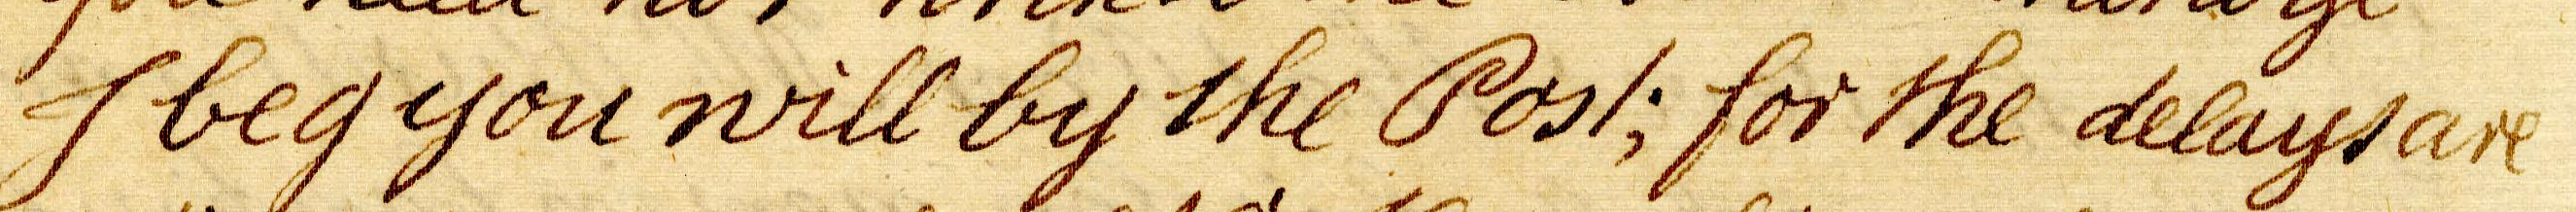I beg you will by the Post; for the delays are
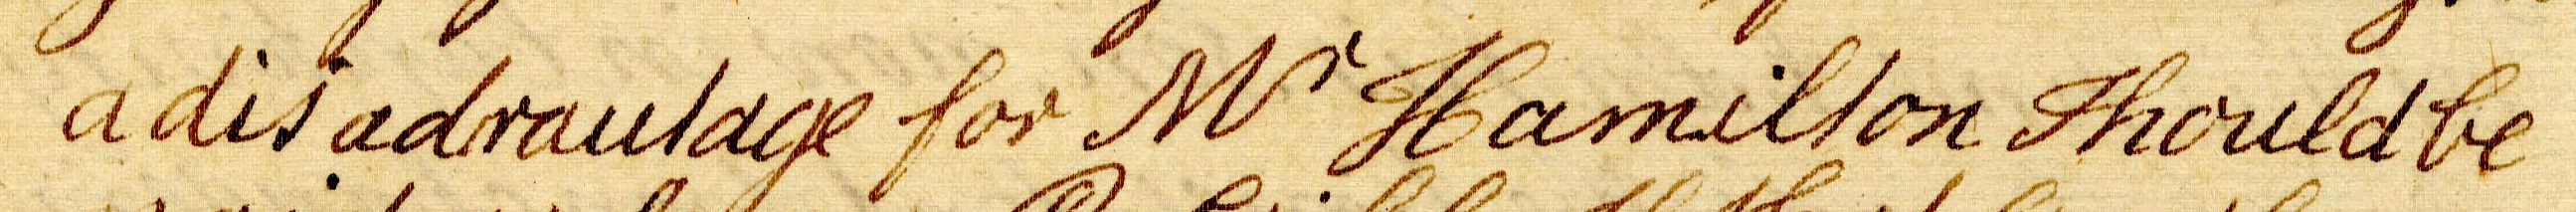a disadvautage for M^r Hamilton Should be
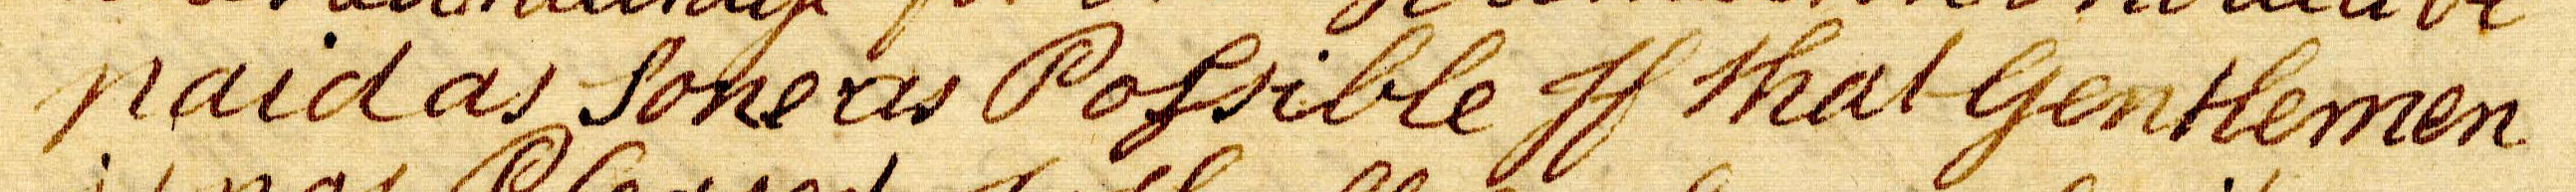paid as Sone as Possible If that Gentlemen
